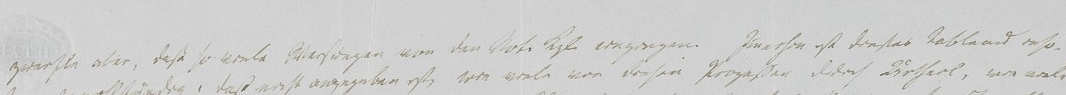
zweifle aber, daß so viele Weisungen von Not.Kzl. eingegangen. Immerhin ist dieses Tableau inso-
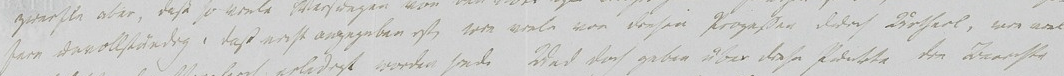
fern unvollständig, daß nicht angegeben ist, wie viele von diesen Prozessen durch Urtheil, wie viele
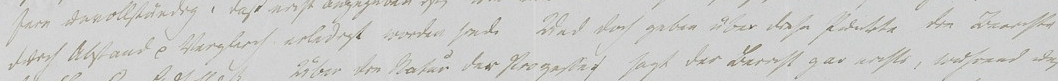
durch Abstand & Vergleich erledigt worden sind. Und doch geben über diese Punkte die Berichte
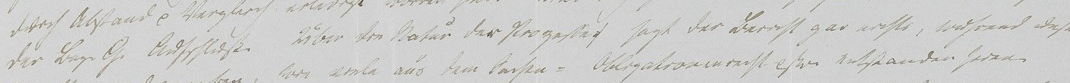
der Bez.G. Aufschluß. Über die Natur der Prozesse sagt der Bericht gar nichts, während unsere
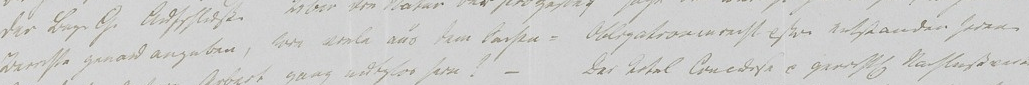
Berichte genau angeben, wie viele aus dem Sachten = Obligationenrecht usw. entstanden seien.
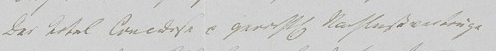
Der Titel Concurse & gerichtliche Nachlaßverträge
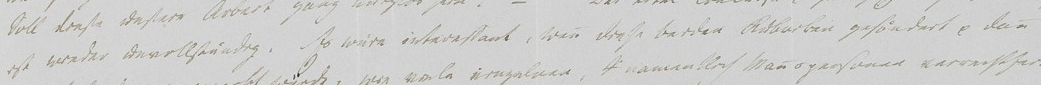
ist wieder unvollständig. Es wäre interessant, wenn diese beiden Rubriken gesondert & dann
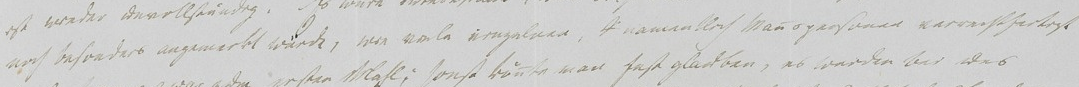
noch besonders angemerkt würde, wie viele einzelnen, namentlich Mannspersonen verrechtfertigt
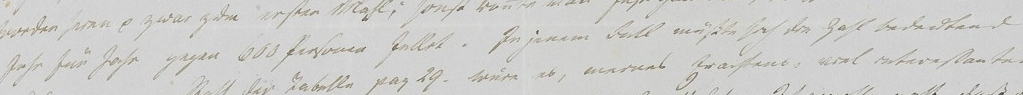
Jahr für Jahr gegen 600 Personen fallit. In jenem Fall müßte sich die Zahl bedeutend
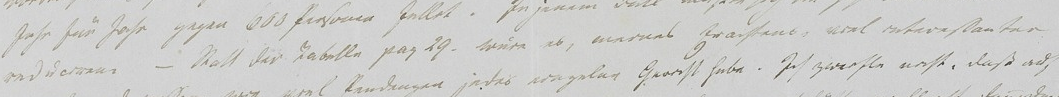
reduciren. – Statt der Tabelle pag 29. wäre es, meines Erachtens, viel interessanter
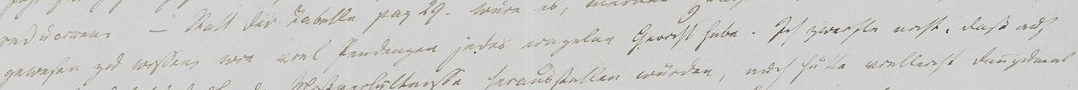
gewesen zu wissen wie viel Pendenzen jedes einzelne Gericht habe. Ich zweifle nicht, daß auf
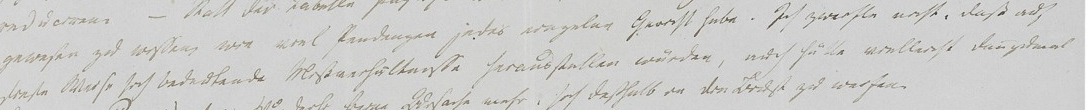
diese Weise sich bedeutende Mißverhältnisse herausstellen würden, auch hätte vielleicht dannzumal
